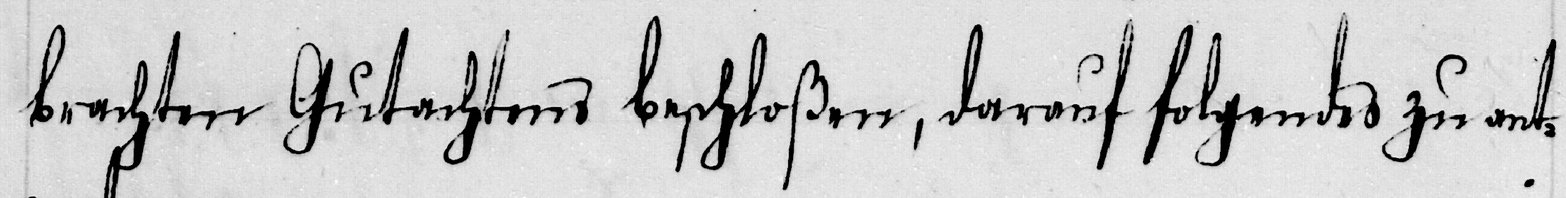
brachten Gutachtens beschloßen, darauf folgendes zu an¬
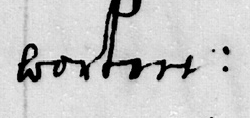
tworten:
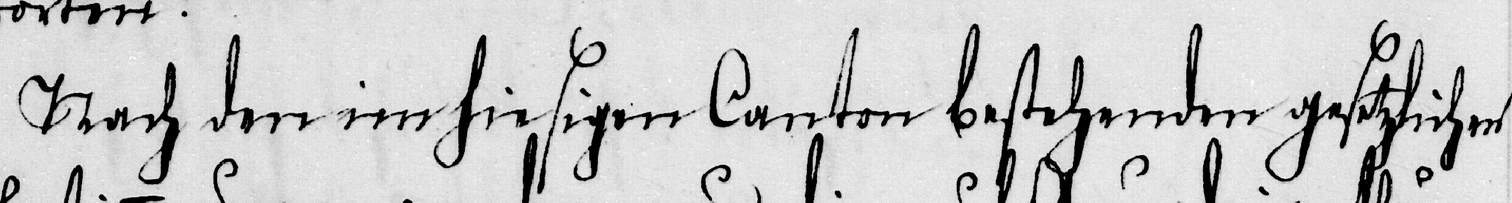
Nach den im hiesigen Canton bestehenden gesetzlich¬
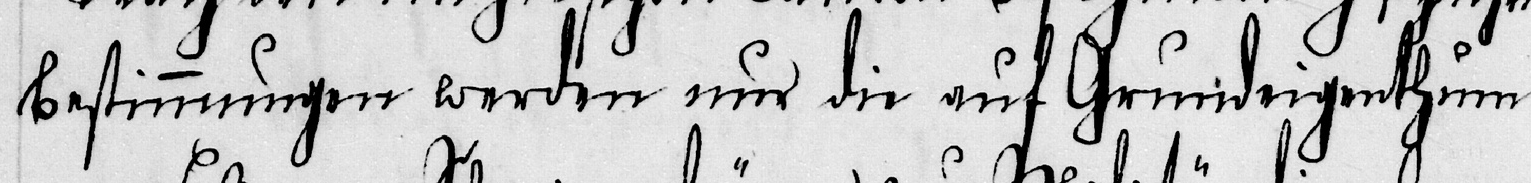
Bestimmungen werden nur die auf Grundeigenthum
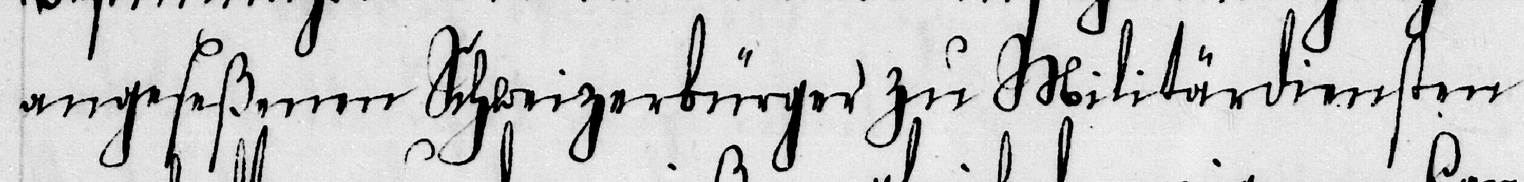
angeseßenen Schweizerbürger zu Militärdiensten
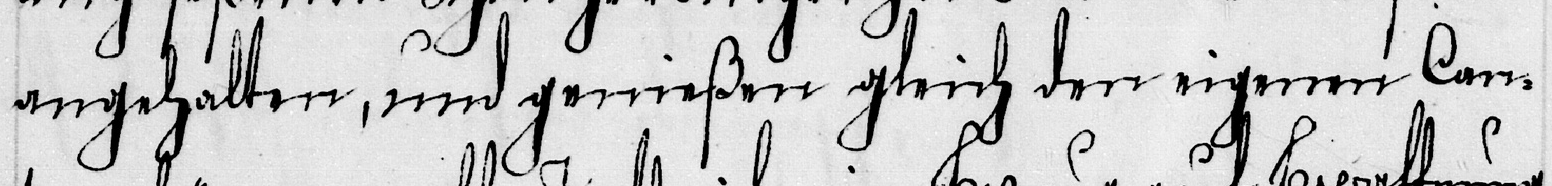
angehalten, und genießen gleich den eigenen Can¬
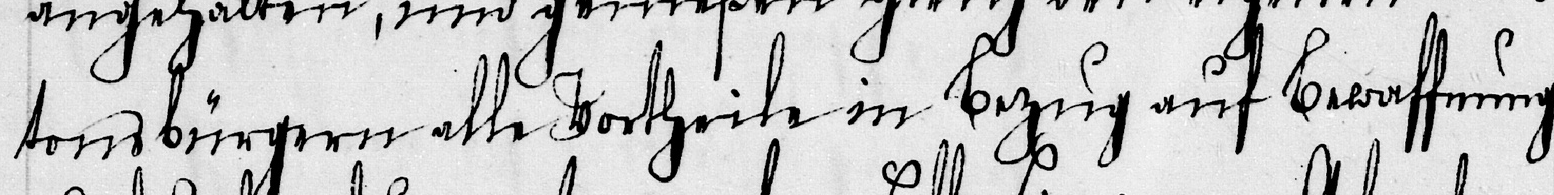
tonsbürgern alle Vortheile in Bezug auf Bewaffnung
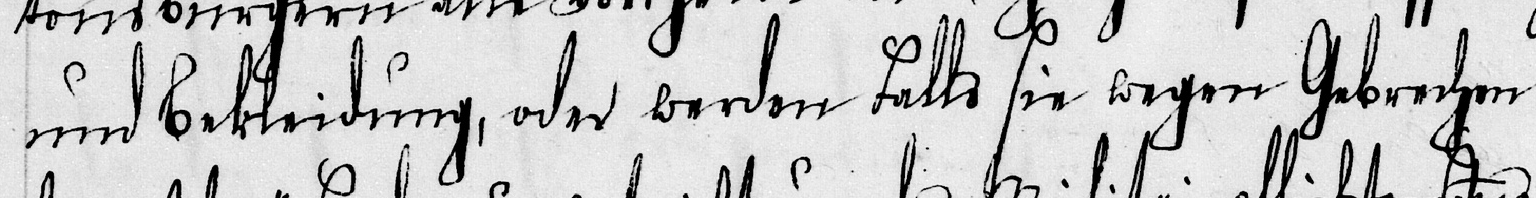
und Bekleidung, oder werden falls sie wegen Gebrechen
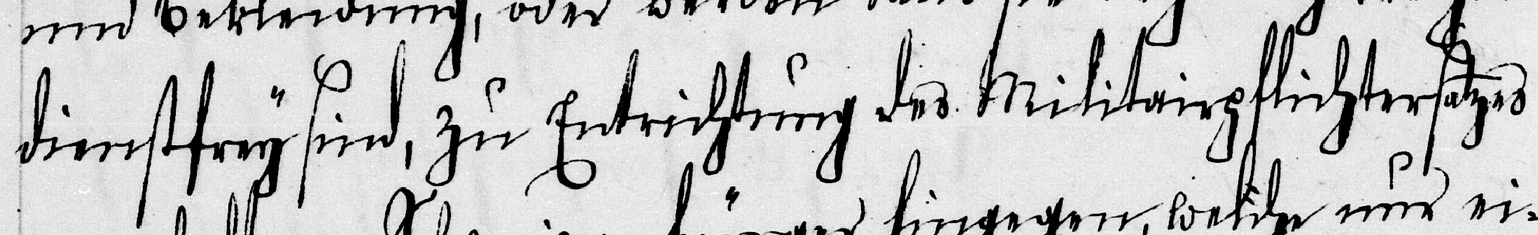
dienstfrey sind, zu Entrichtung des Militairpflichtersatz¬
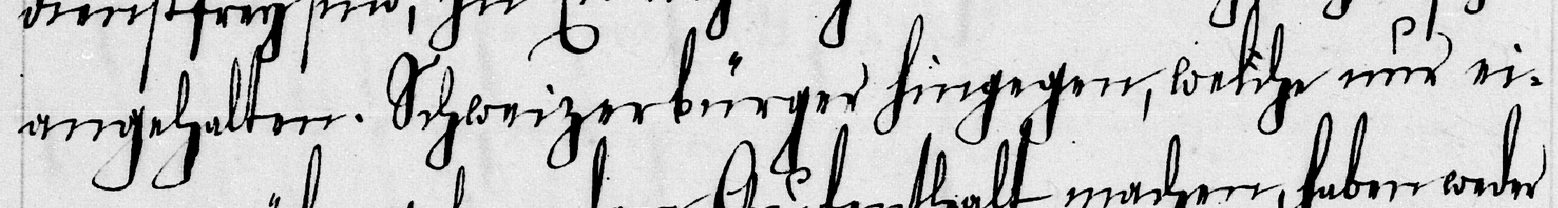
angehalten. Schweizerbürger hingegen, welche nur ei¬
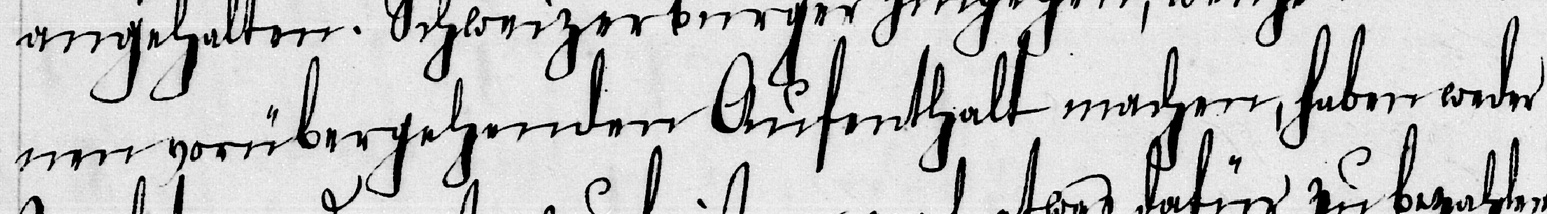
nen vorübergehenden Aufenthalt machen, haben weder
